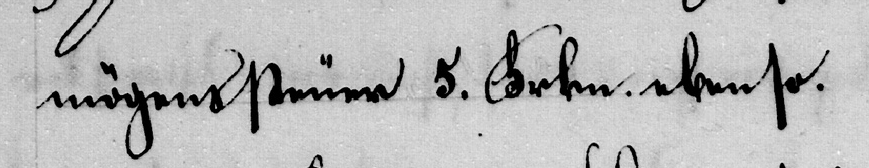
mögenssteuer 5. Frkn. ebenso.
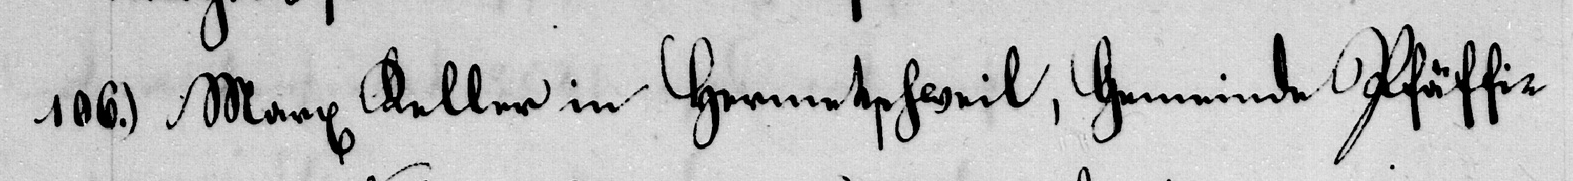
106.) Marx Keller in Hermetschweil, Gemeinde Pfäffi¬
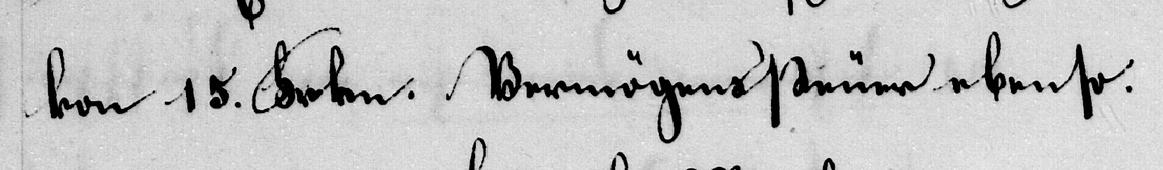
kon 15. Frkn. Vermögenssteuer ebenso.
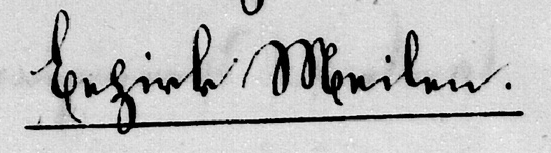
Bezirk Meilen.
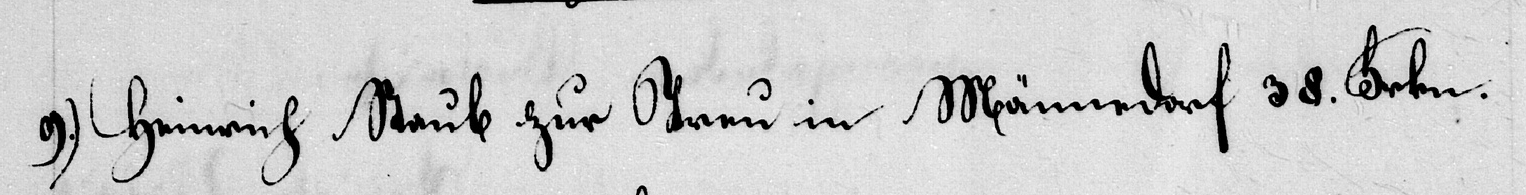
9.) Heinrich Staub zur Treu in Männedorf 38. Frkn.
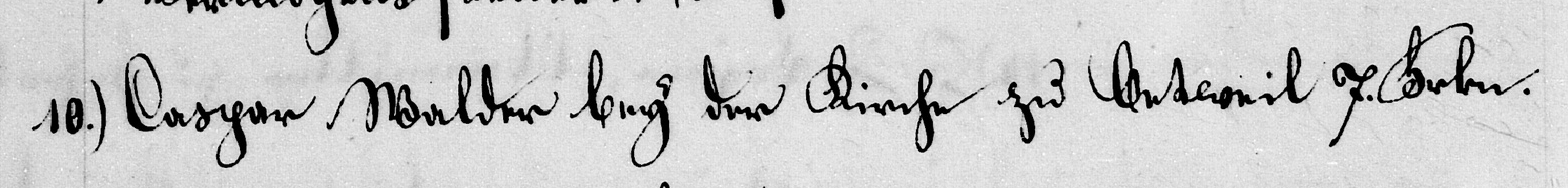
10.) Caspar Walder bey der Kirche zu Oetweil 7. Frkn.
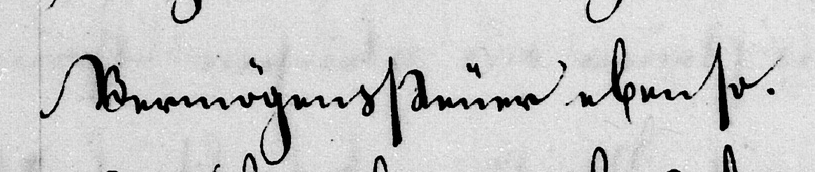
Vermögenssteuer ebenso.
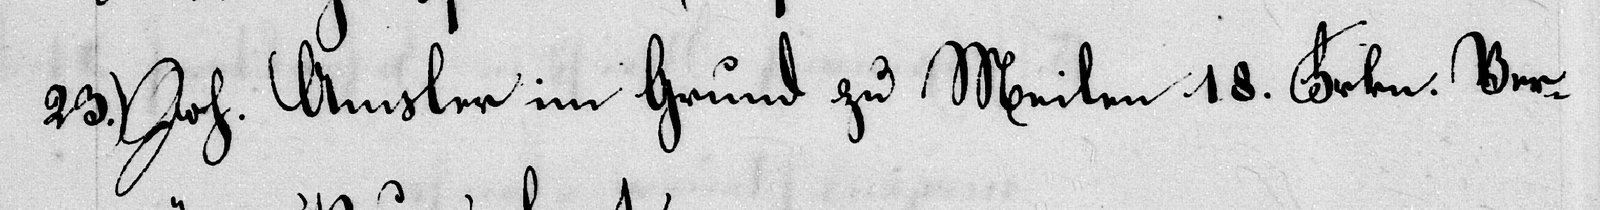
23.) Joh. Amsler im Grund zu Meilen 18. Frkn. Ver¬
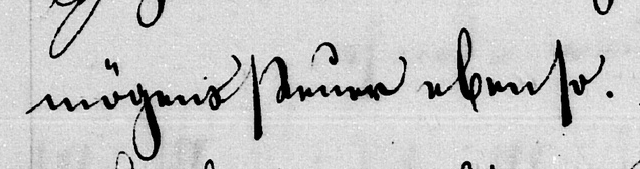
mögenssteuer ebenso.
